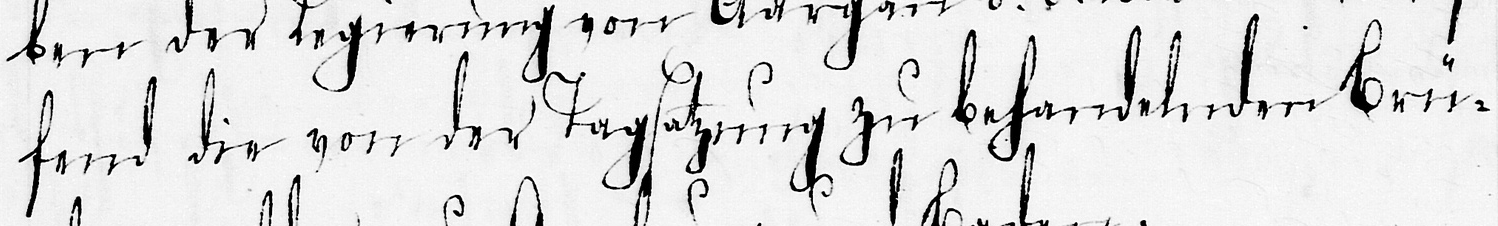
fend die von der Tagsatzung zu behandelnden Brü¬
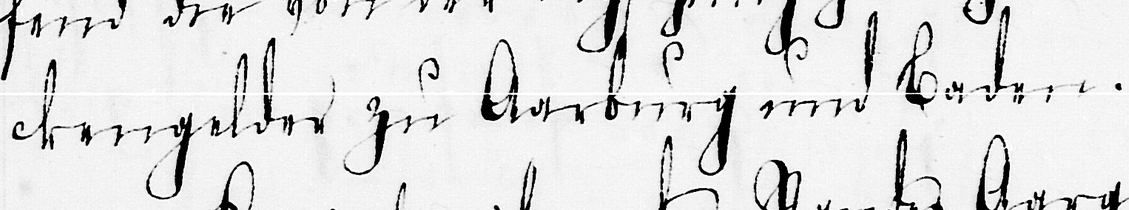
ckengelder zu Aarburg und Baden.
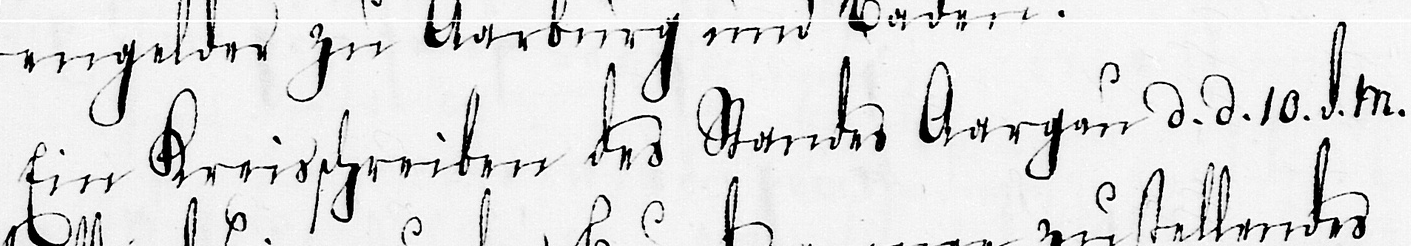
Ein Kreisschreiben des Standes Aargau d. d. 10. d. M.
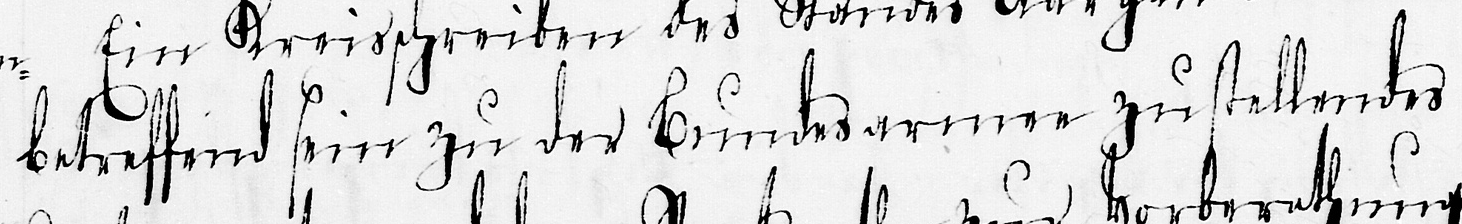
betreffend sein zu der Bundesarmee zu stellendes
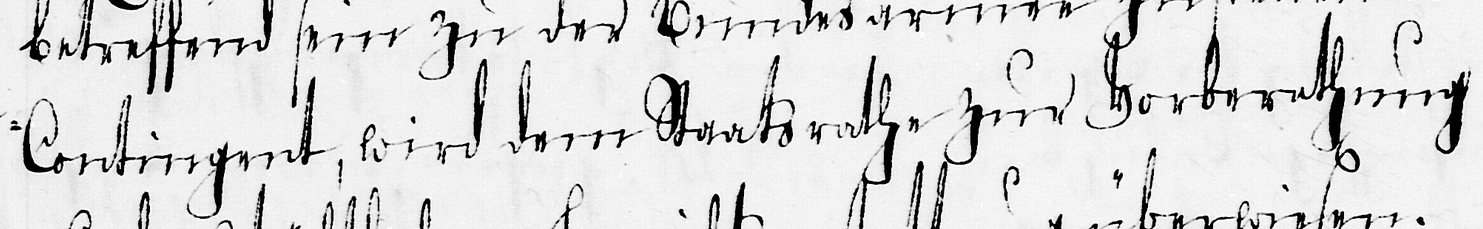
Contingent, wird dem Staatsrathe zur Vorberathung
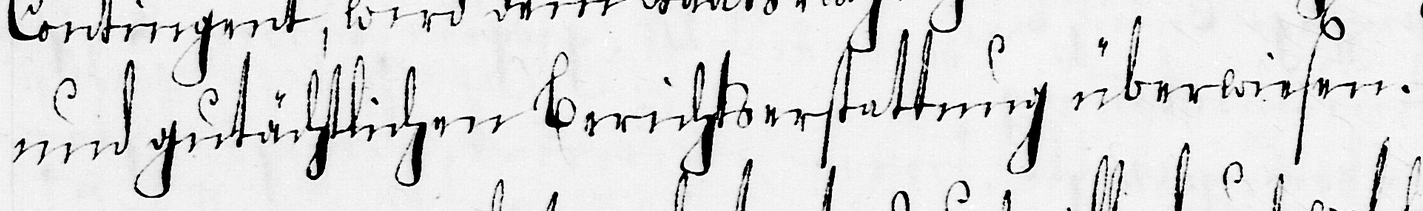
und gutächtlichen Berichtserstattung überwiesen.
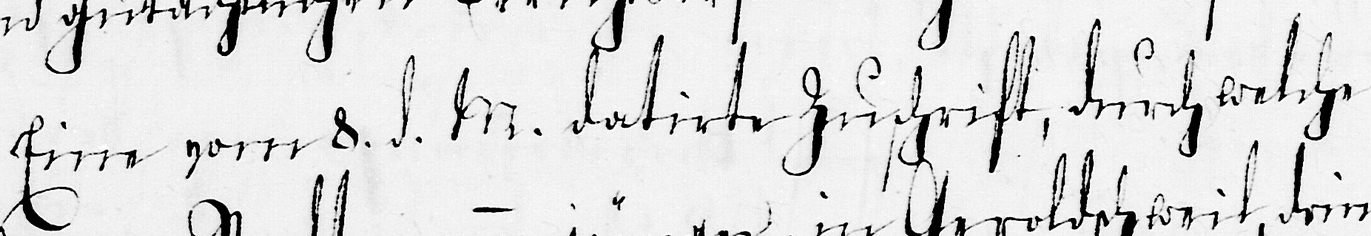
Eine vom 8. d. M. datirte Zuschrift, durch welche
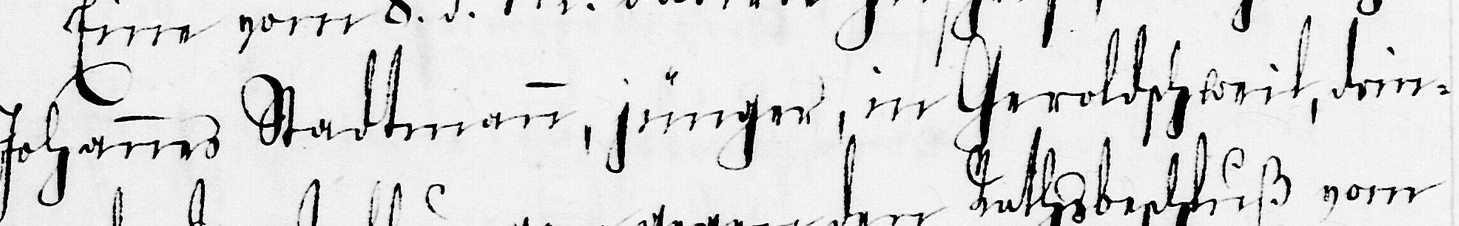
Johannes Stadtmann, jünger, in Geroldschweil, drin¬
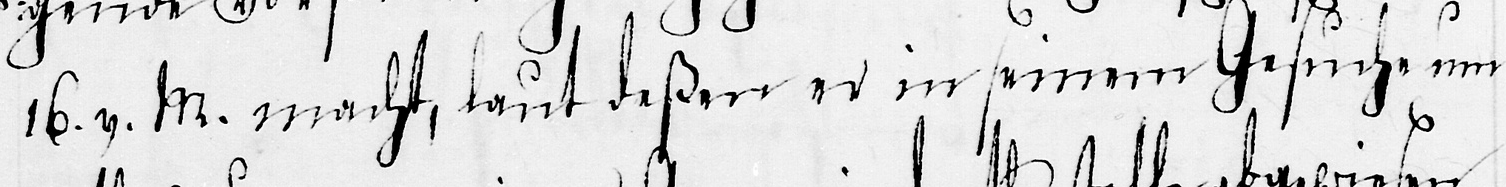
16. v. M. macht, laut deßen er in seinem Gesuche um
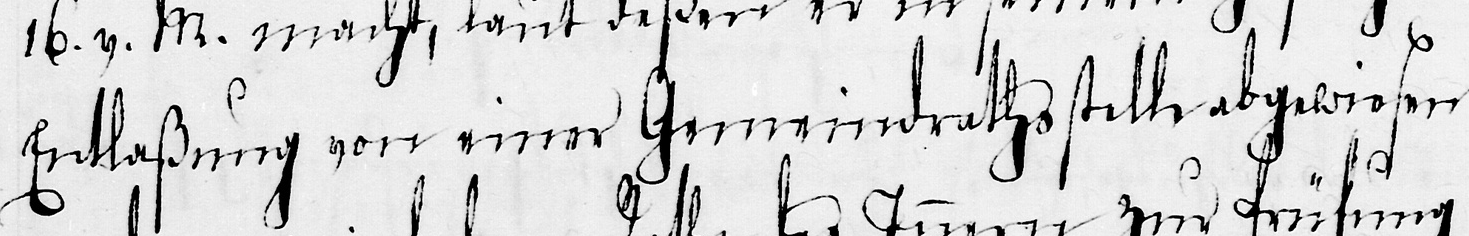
Entlaßung von einer Gemeindrathsstelle abgewiesen
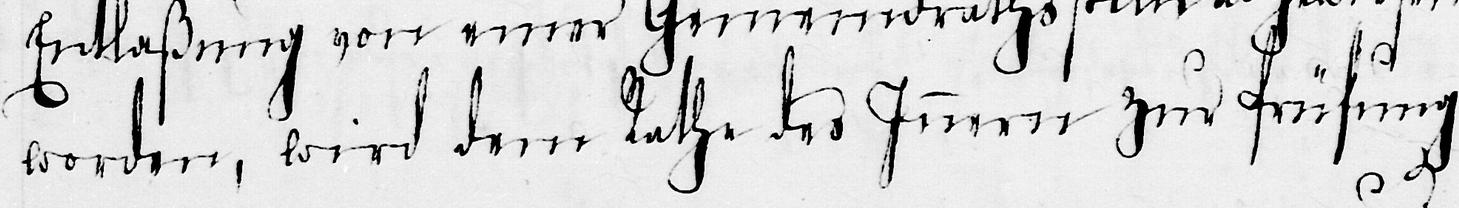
worden, wird dem Rathe des Innern zur Prüfung
